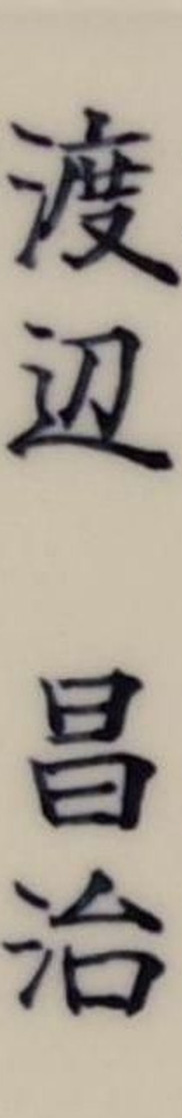渡辺昌治
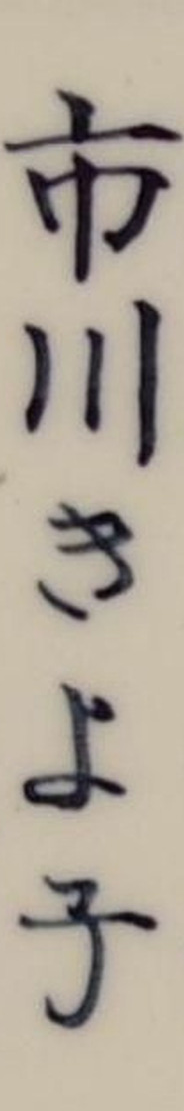市川きよ子
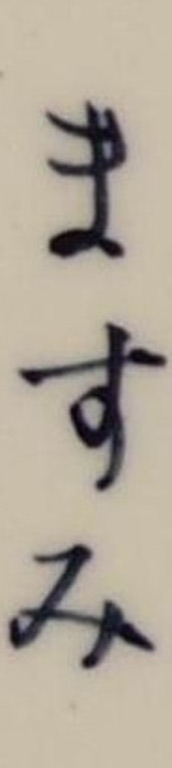ますみ
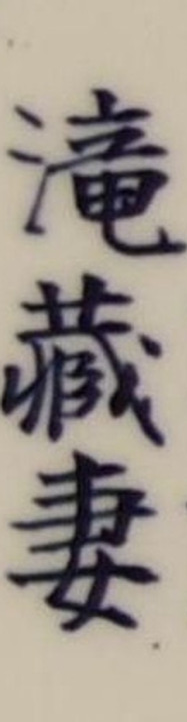滝蔵妻
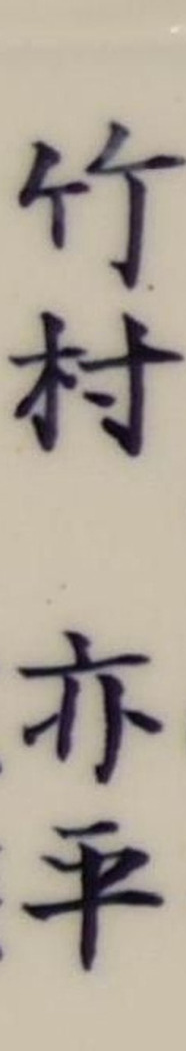竹村亦平
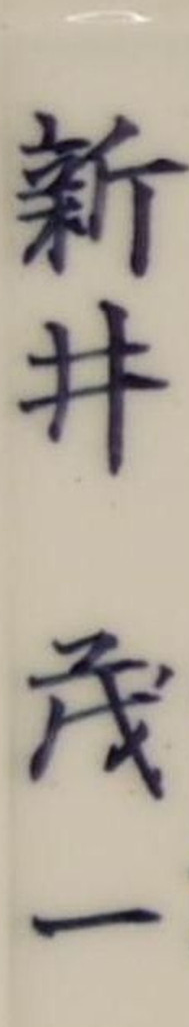新井茂一

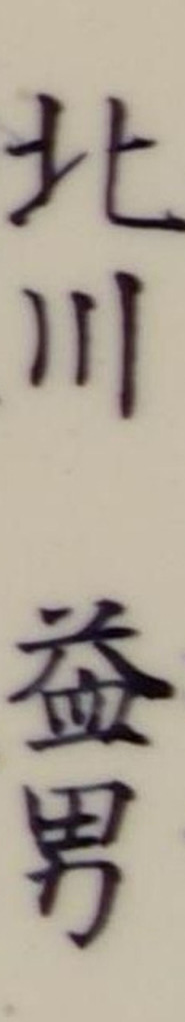北川益男
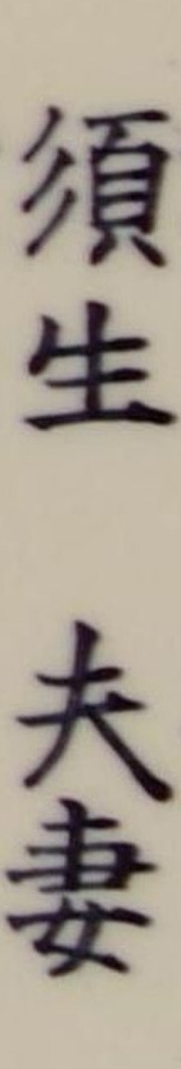須生夫妻
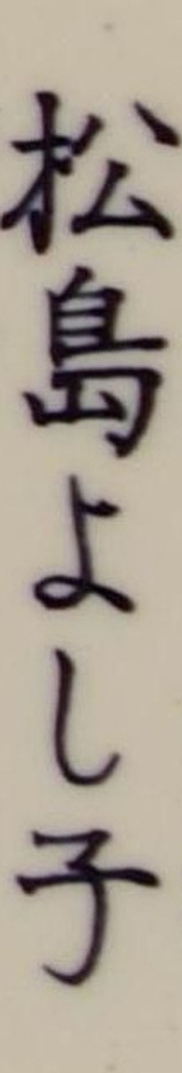松島よし子
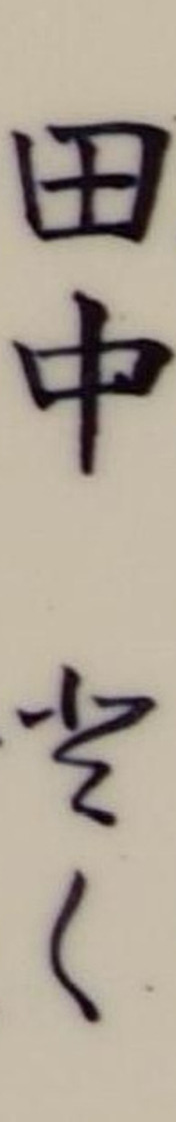田中とく
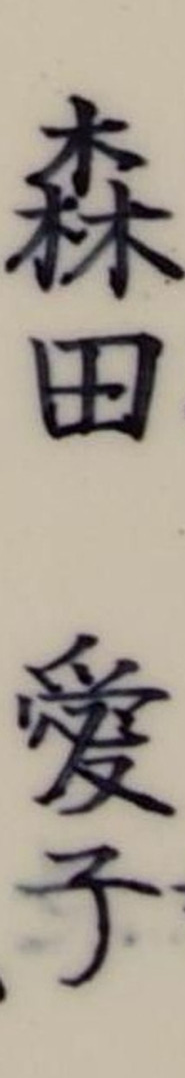森田愛子
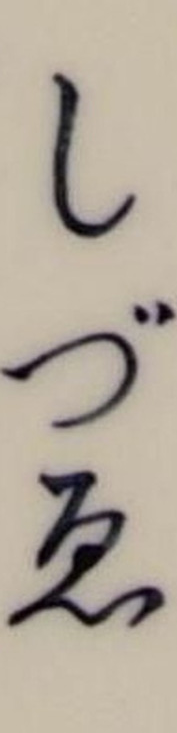しづゑ
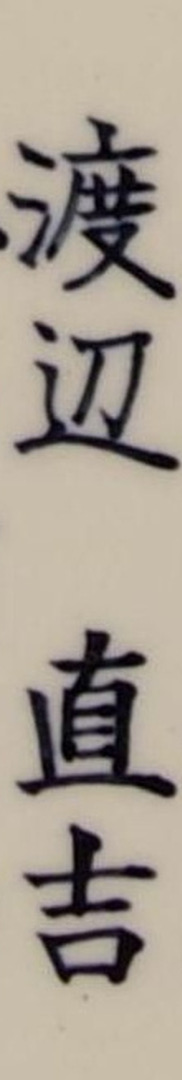渡辺直吉
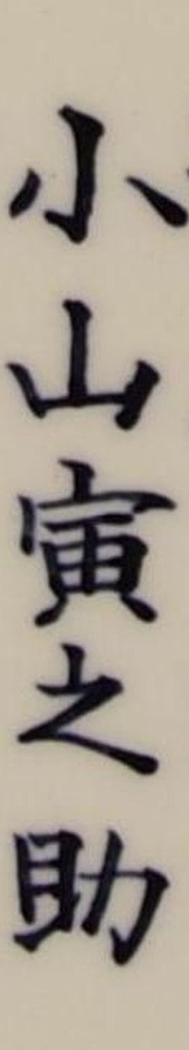小山寅之助
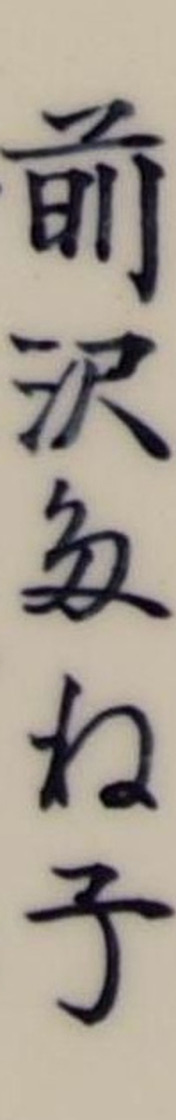前沢たね子
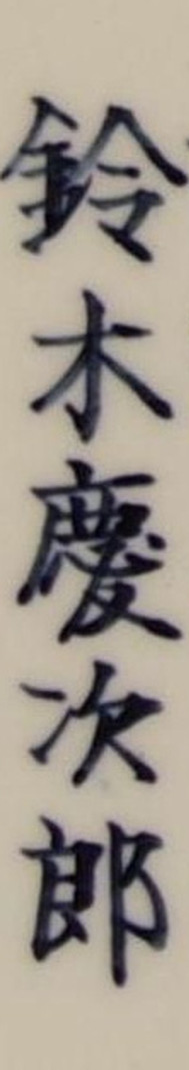鈴木慶次郎
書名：E~L
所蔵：高野山金剛峯寺
